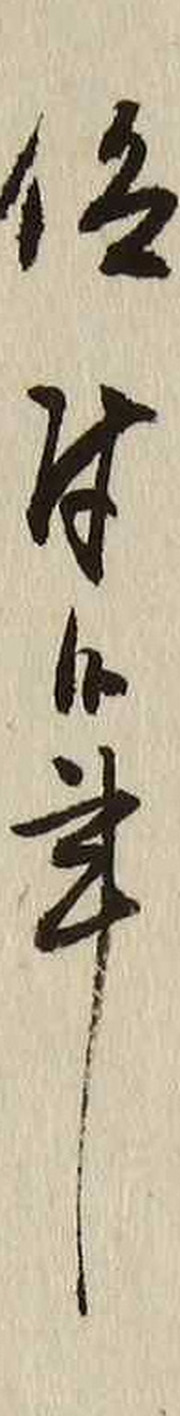仰付候事
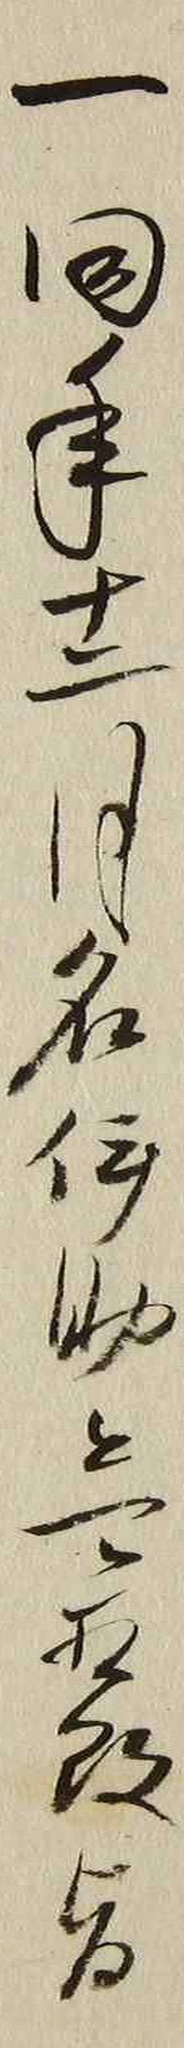一同年十二月名伊助と可相改旨
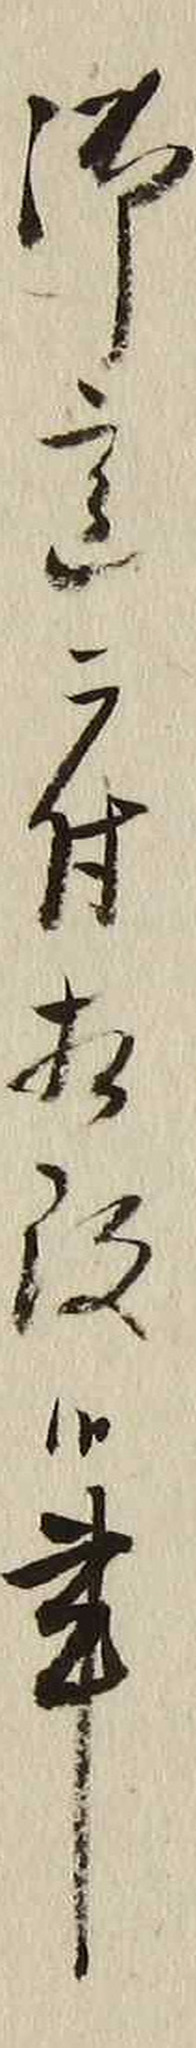御意ニ付相改候事
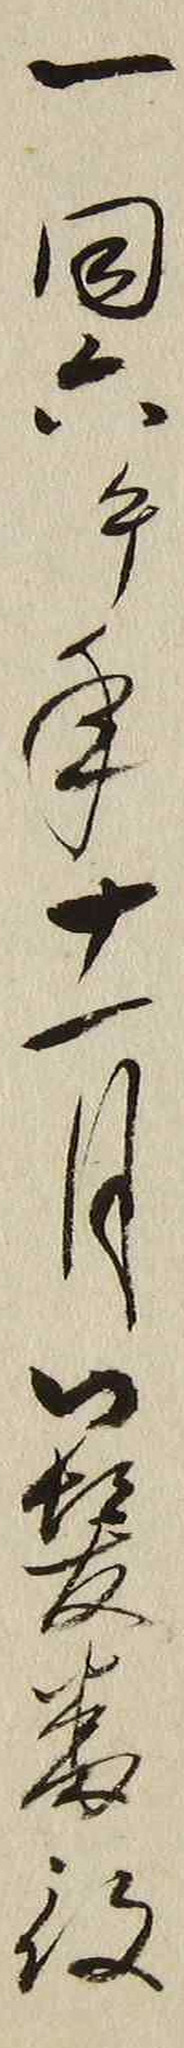一同六午年十一月御髪番役
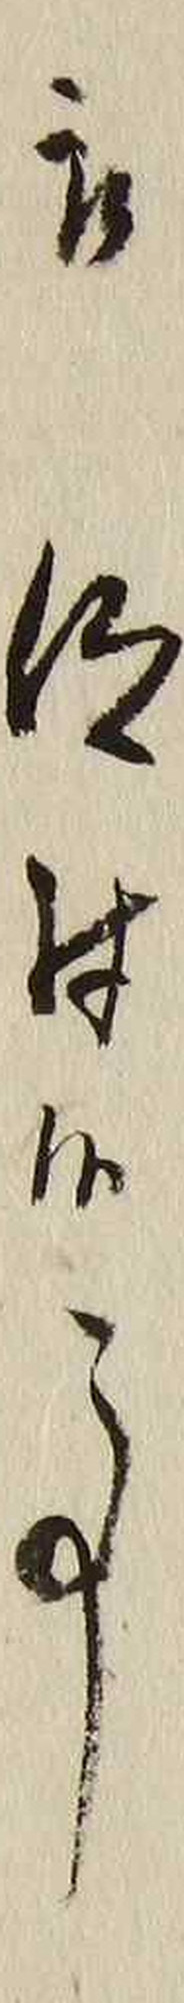被仰付候事
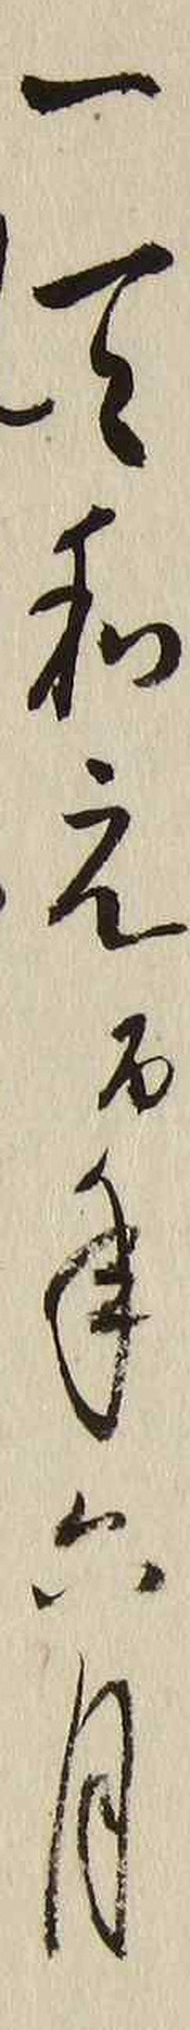一天和元酉年六月
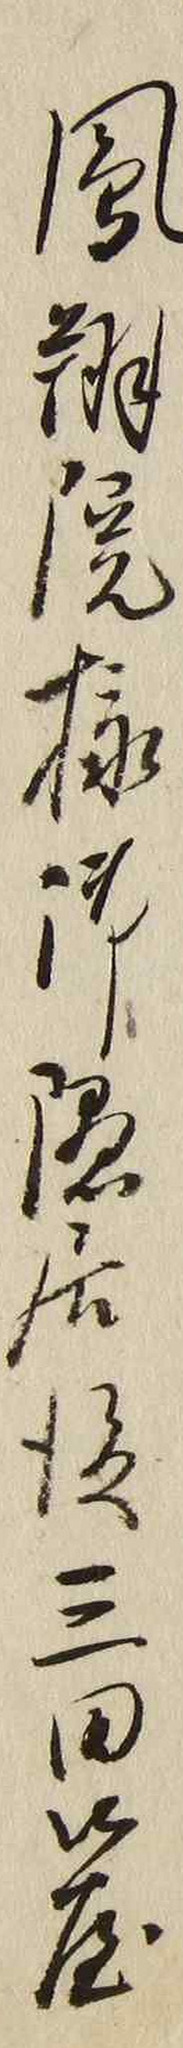鳳翔院様御隠居後三田御屋

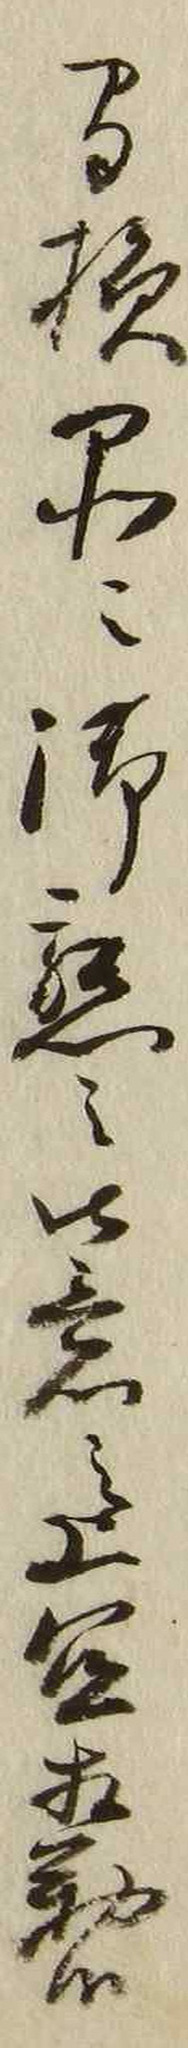守様品々御懇之御意之上宜相勤候
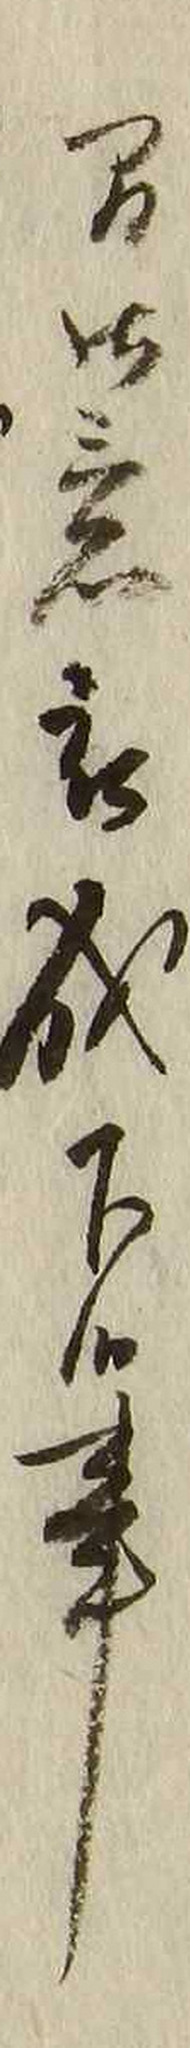間御意被成下候事
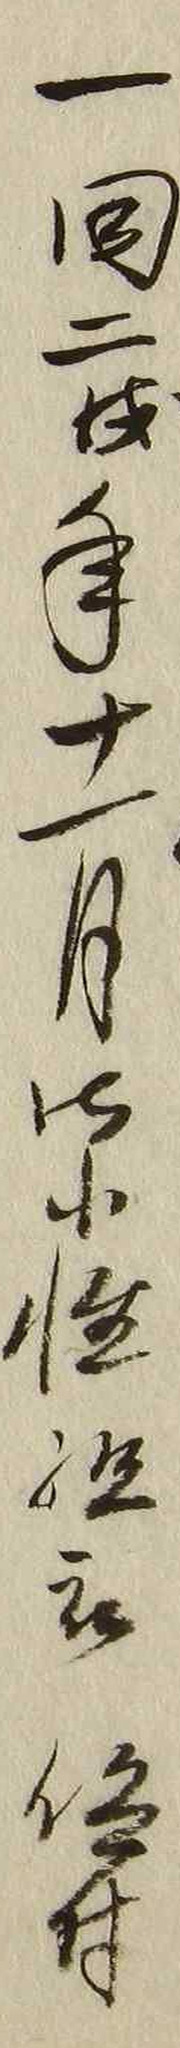一同二戌年十一月御小性組被仰付
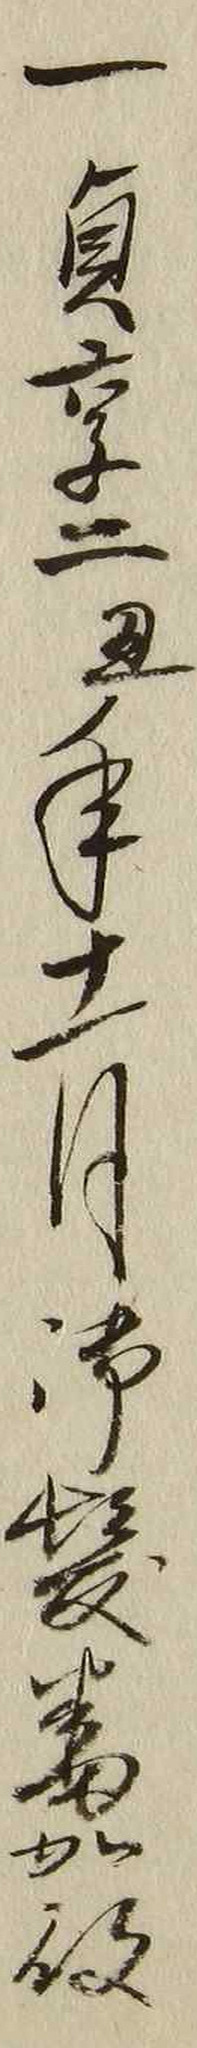一貞享二丑年十一月御髪番加役
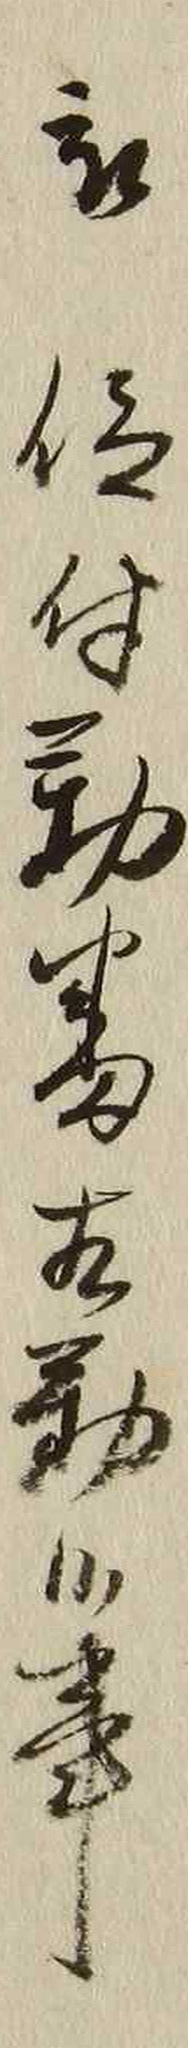被仰付勤番相勤候事
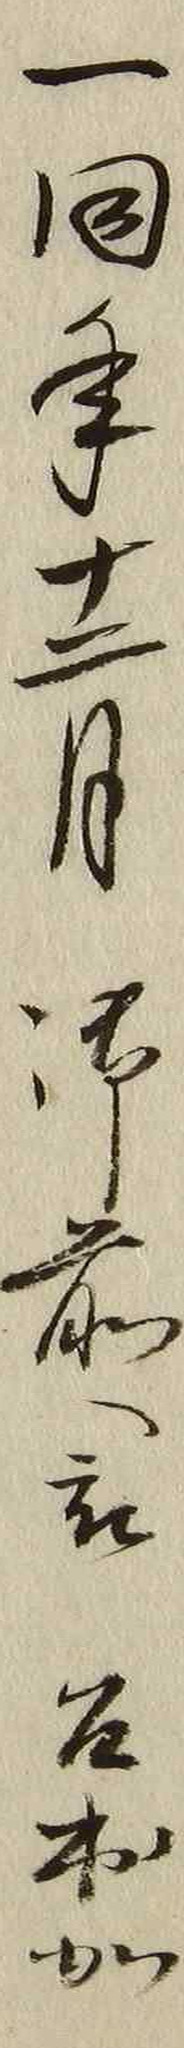一同年十二月御前へ被召出加
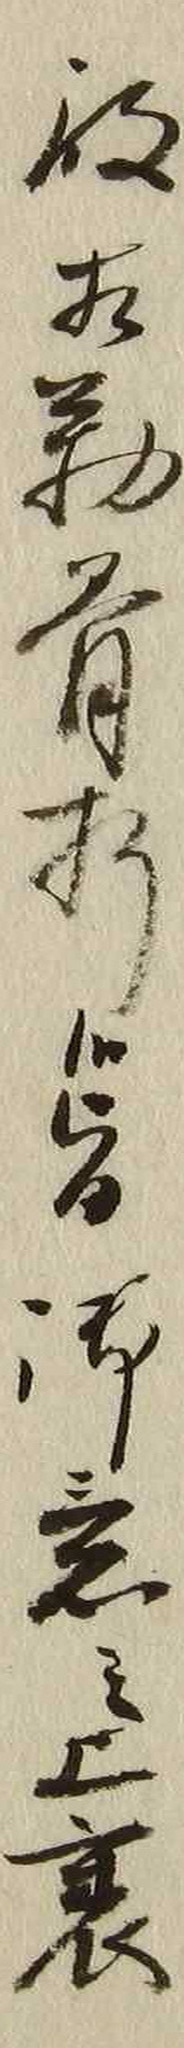役相勤骨折候旨御意之上裏
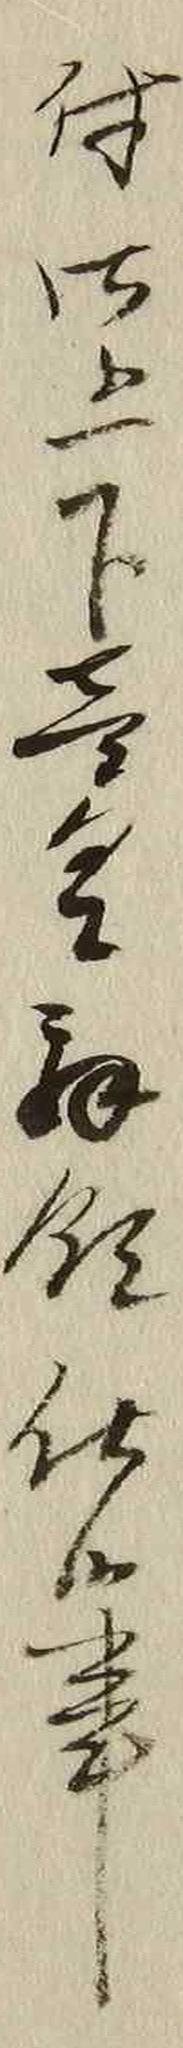付御上下壱具拝領仕候事
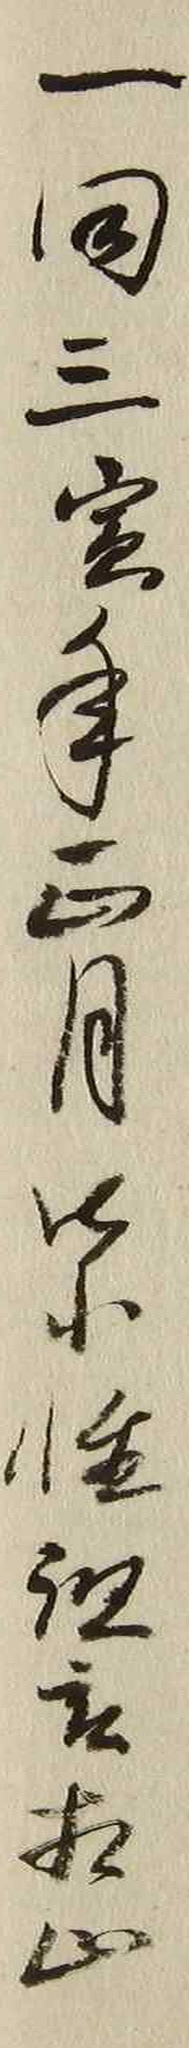一同三寅年正月御小性組被相止
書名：諸士系譜　巻之351　す之部1
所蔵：会津若松市立会津図書館
